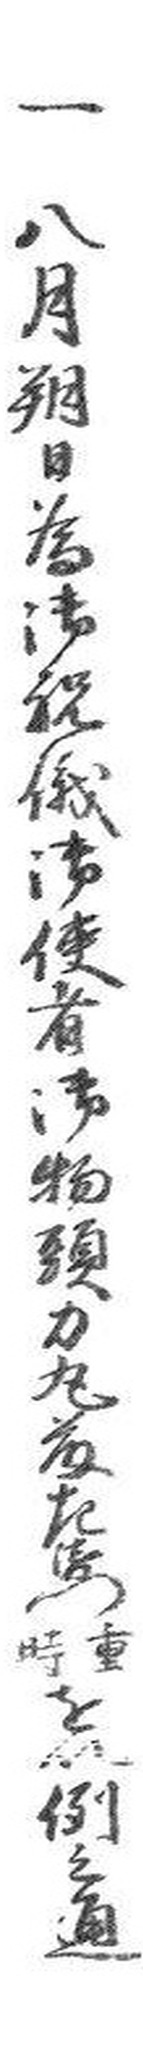一八月朔日為御祝儀御使者御物頭力丸藤左衛門重時を以例之通
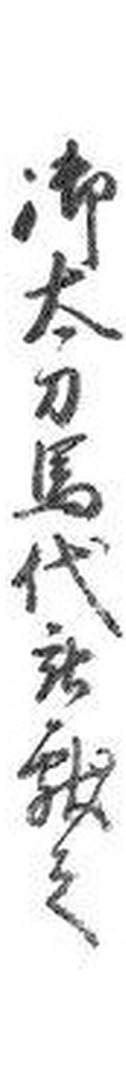御太刀馬代被献之
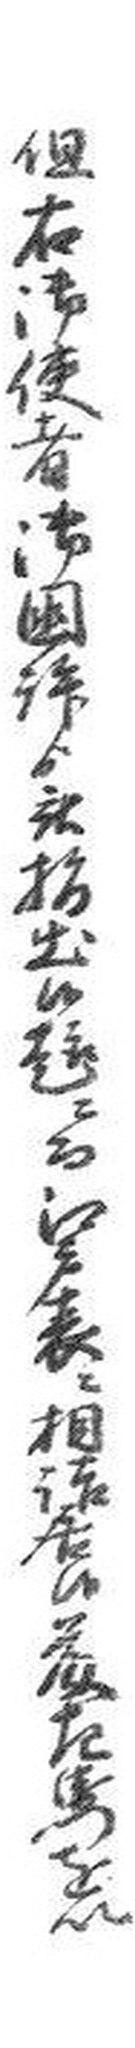但右御使者御国許ゟ被指出候趣ニ而江戸表ニ相詰居候藤左衛門を以
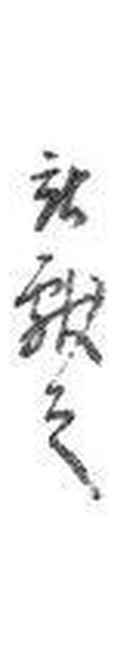被献之
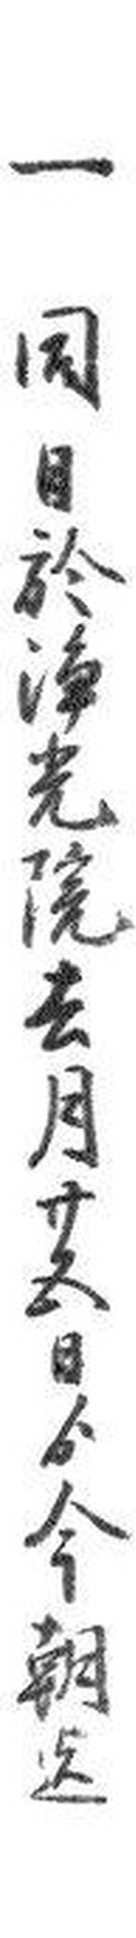一同日於浄光院去月廿五日ゟ今朝迄
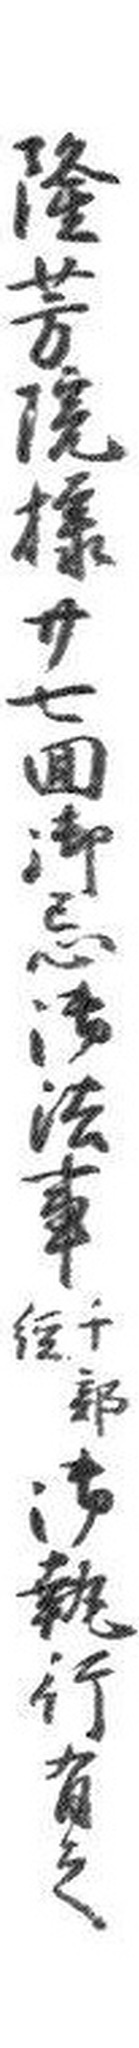隆芳院様廿七回御忌御法事千部経御執行有之
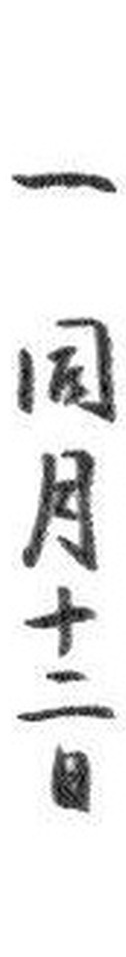一同月十二日
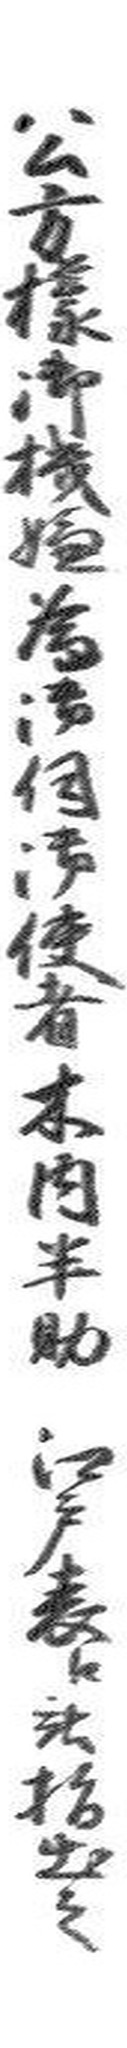公方様御機嫌為御伺御使者木内半助江戸表江被指出之
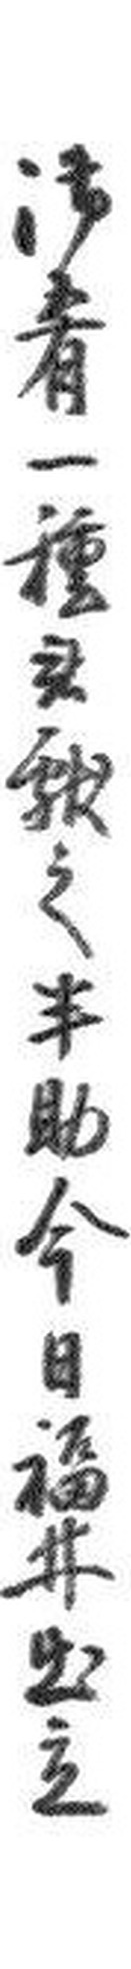御肴一種被献之半助今日福井出立
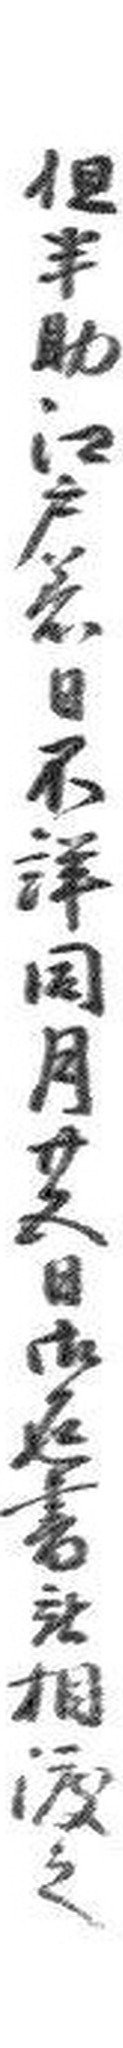但半助江戸着日不詳同月廿五日御返書被相渡之
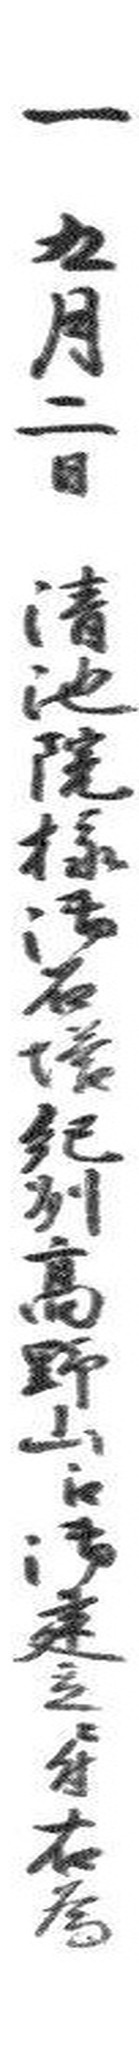一九月二日清池院様御石塔紀州高野山江御建立ニ付右為
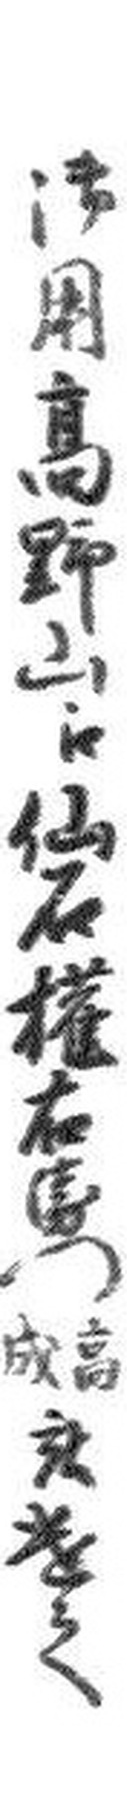御用高野山江仙石権右衛門高成被遣之
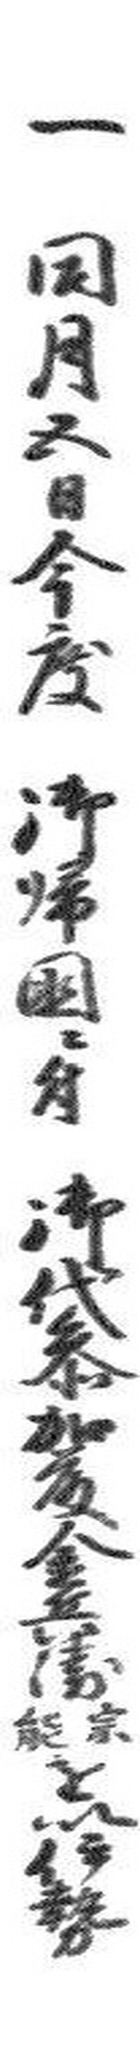一同月五日今度御帰国ニ付御代参加藤金兵衛宗能を以伊勢
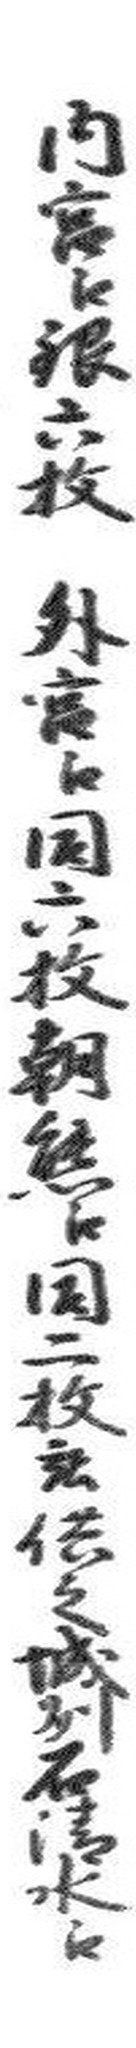内宮江銀六枚外宮江同六枚朝熊江同二枚被供之城州
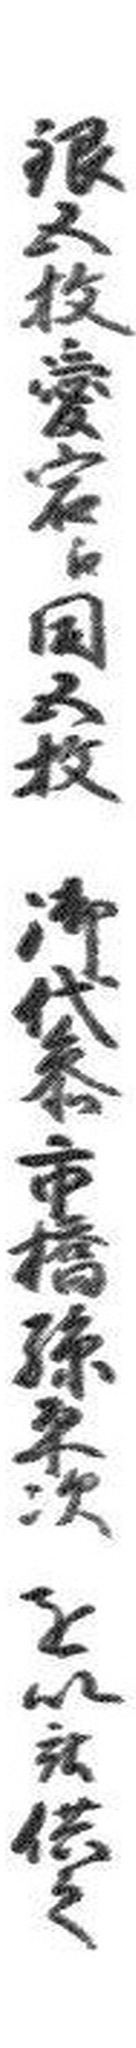銀五枚愛宕江同五枚御代参市橋弥平次を以被供之
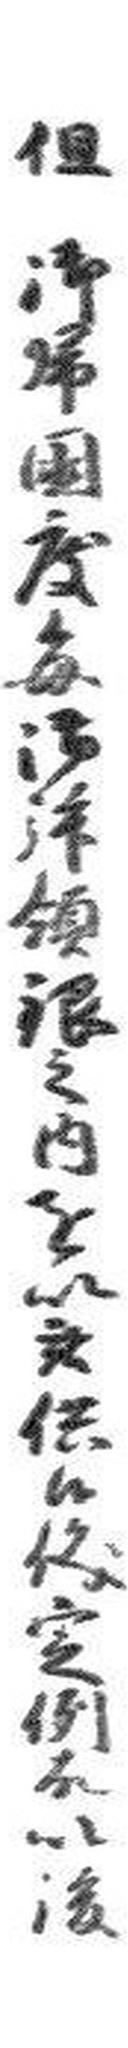但御帰国度毎御拝領銀之内を以被供候儀定例故以後
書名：家譜 八 光通公 従寛文十年到同十二年
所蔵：福井県文書館 Fukui Prefectural Archives
